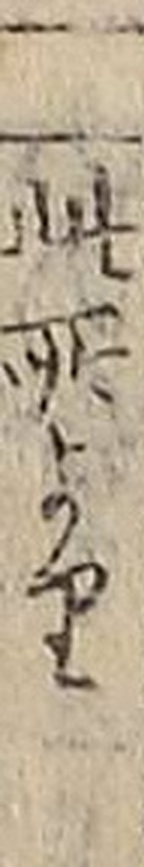此所より
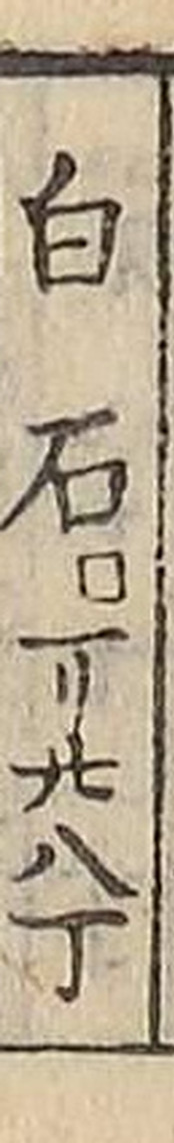白石▫一リ廿八丁
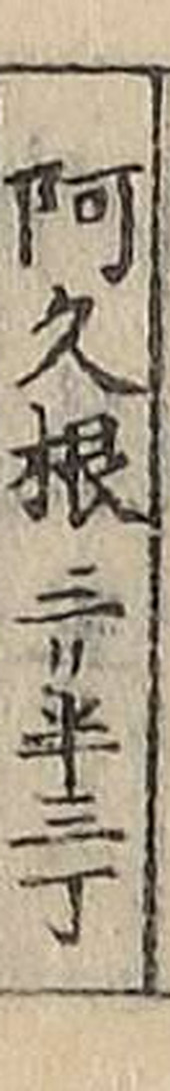阿久根三リ半三丁
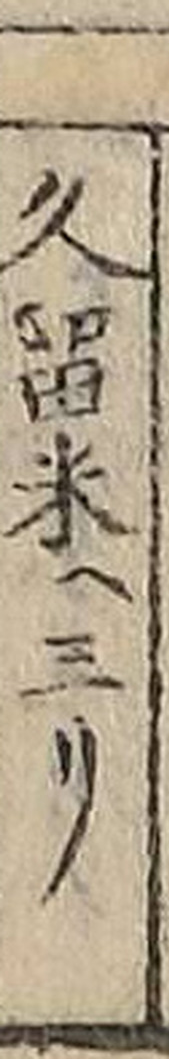久留米へ三リ
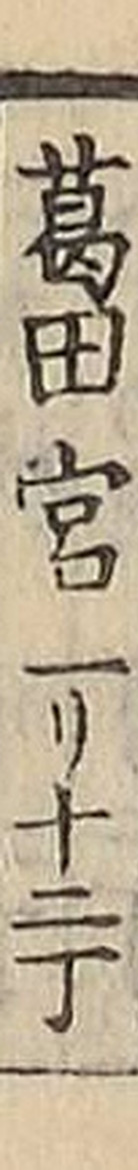葛田宮一リ十二丁
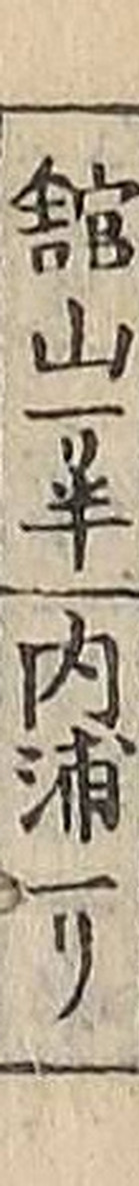館山一リ半内浦一リ
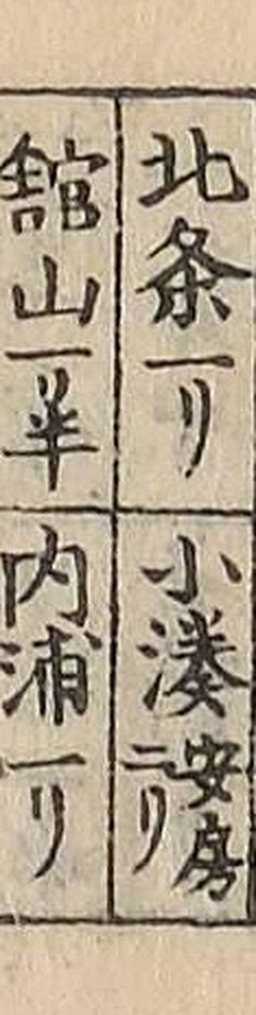館山一リ半内浦一リ
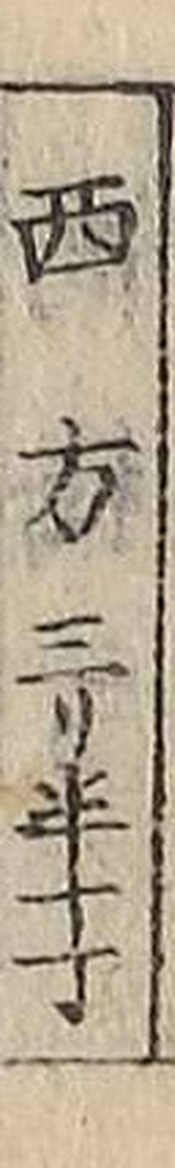西方三リ半十丁
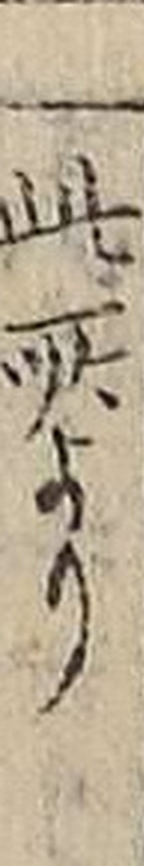此所より
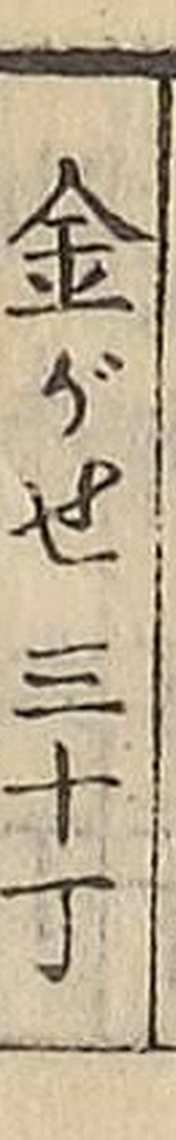金がせ三十丁
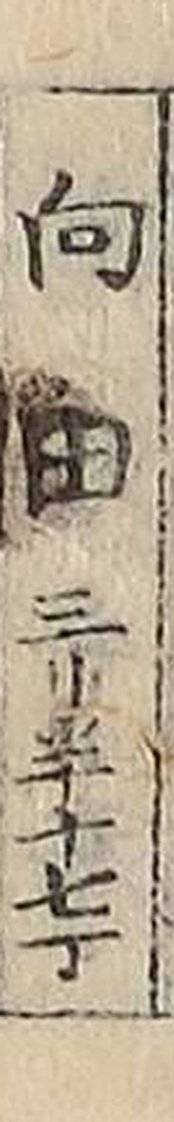向田三リ半七丁
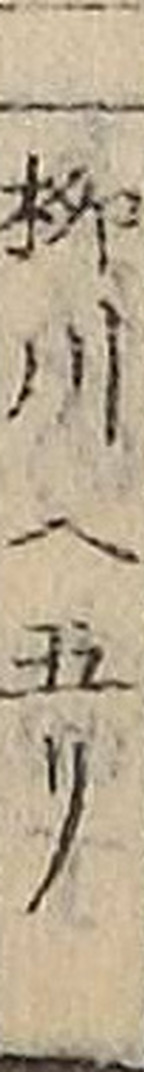柳川へ五リ
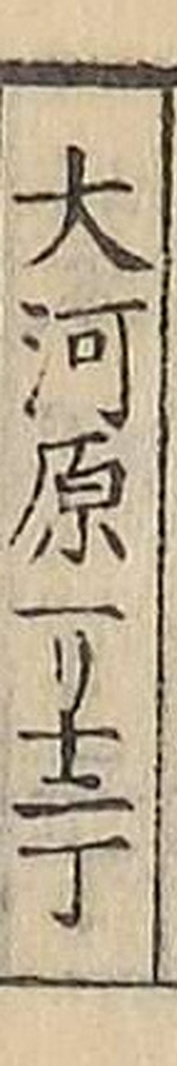大河原一リ十二丁
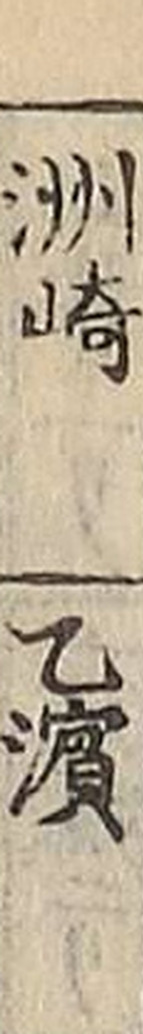洲崎乙浜
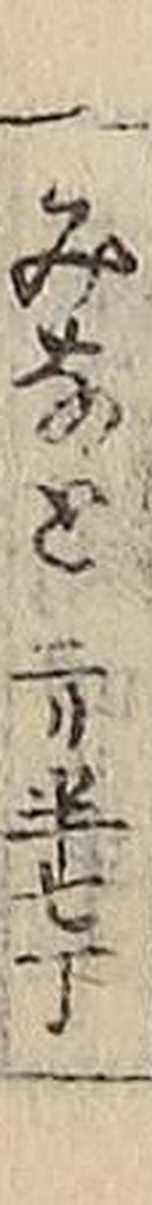みなと二リ半七丁
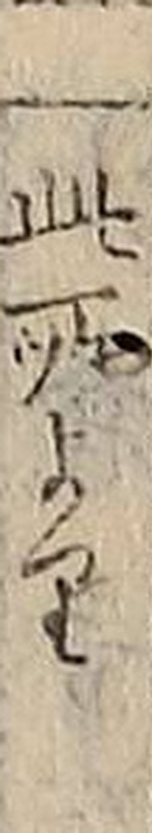此所より
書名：旅行用心集
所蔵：神戸大学附属図書館 国文学研究資料館
